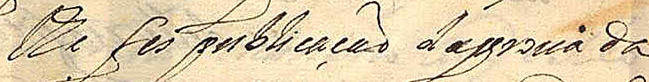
lhe fes publicação da proua da
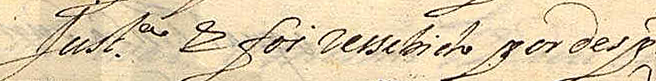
Just.a E foi ressebido por desp.o
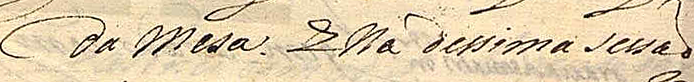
da Mesa. E Na dessima sessão
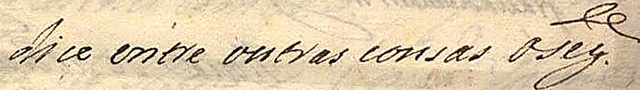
dice entre outras cousas o segte.
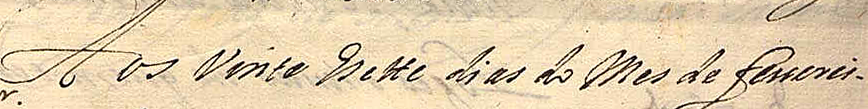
Aos Vinte E sette dias do Mes de feuerei
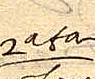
2a ta
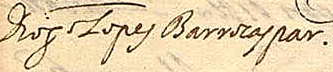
Diogo Lopes Barrocas par.
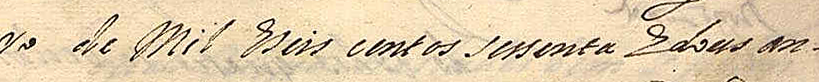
ro de Mil E seiscentos sessenta E dous an
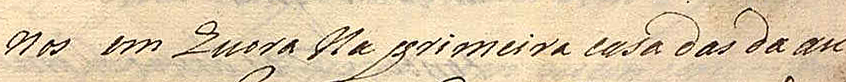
nos em Euora Na primeira casa das da au
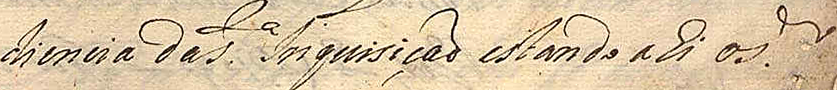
diencia da s.ta Inquisição estando ahi o s.or
